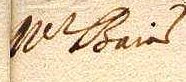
Mel Baiā
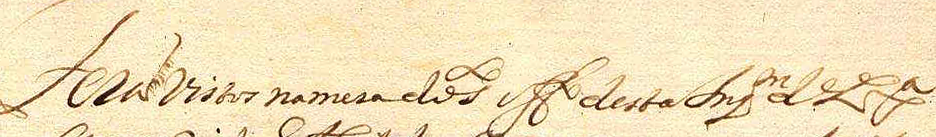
Foraõ vistos na meza do sto offo desta Inqm de Lxa
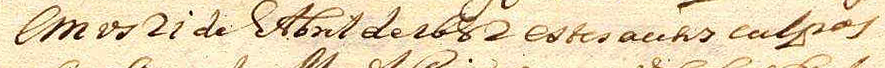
em os 2i de Abril de 1682 estes autos culpas
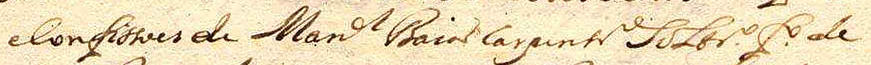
e Confissoes de Manel Baiā Carpintro soltr.o f.o de
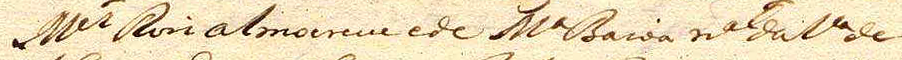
Mel Roiz almocreue e de Ma Baioa nal da Va de
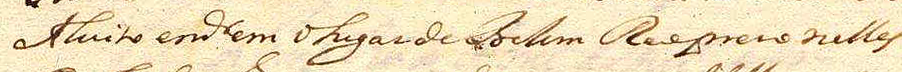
Aluito e mor em o lugar de Belem Reo prezo nelles
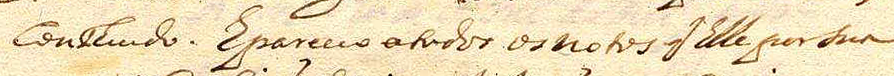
Contheudo. E pareceo a todos os uotos q̄ Elle por sua
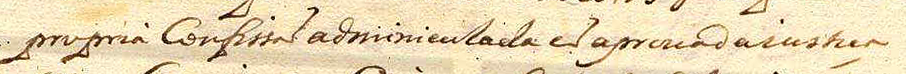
propria Confissaõ adminiculada cō a proua da iustiça
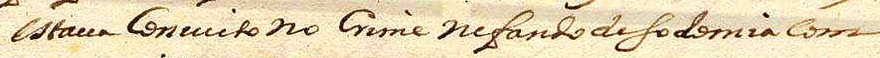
estaua Conuicto no Crime nefando de sodomia com
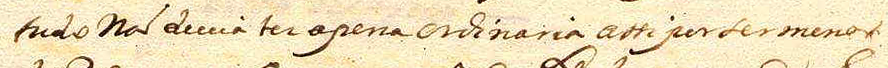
tudo naõ deuia ter a pena ordinaria assi por ser menor
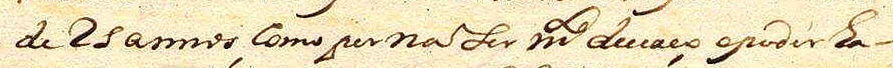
de 25 annos como por naõ ser mto deuaço e poder ha
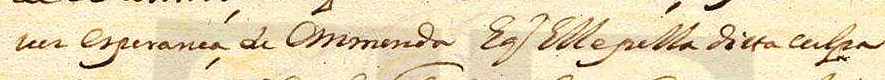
uer esperança de Emmenda E q̄ Elle pella ditta culpa
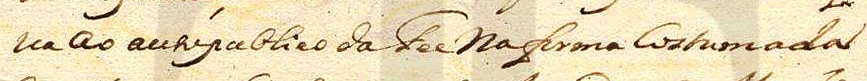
ua ao auto publico da Fee na forma Costumada
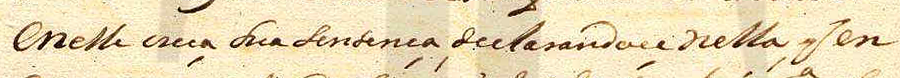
e nelle ouça sua sentença, declarandoce nella, q̄ en
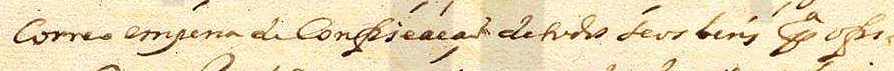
correo em pena de Confiscaçaõ de todos seos bens pa o fi
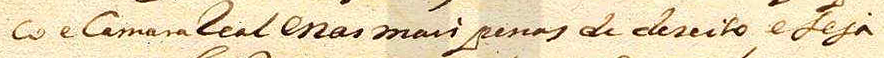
co e Camara Real e nas mais penas de dereito e seja
